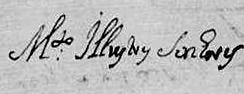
Mt:o Illustres Senhores
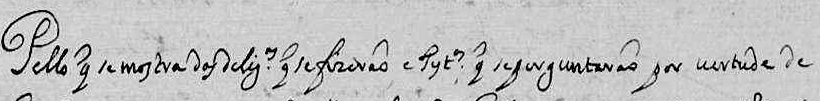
Pello q̄ se mostra das delig.as q̄ se fizeraõ e Testas. q̄ se perguntaraõ por uertude de
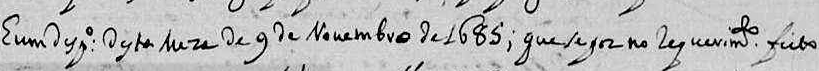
hum desp.o desta Meza de 9 de Nouembro de 1685; que se por no Requerim.to feito
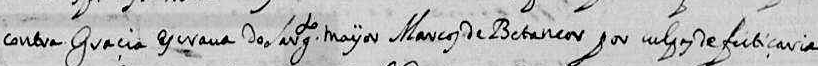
contra Gracia escraua do Sarg.to mayor Marcos de Betancor por culpas de feitiçaria
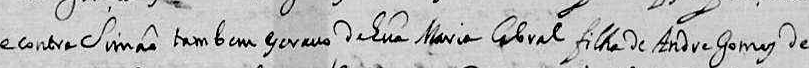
e contra Simaõ tambem escrauo de huā Maria Cabral filha de Andre Gomes de
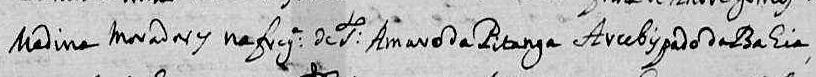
Medina moradores na frega: de S:to Amaro da Pitanga Arcebispado da Bahia,
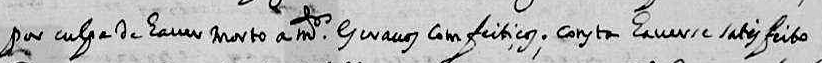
por culpa de hauer morto a m.tos escrauos com feitiços; consta hauerse satisfeito
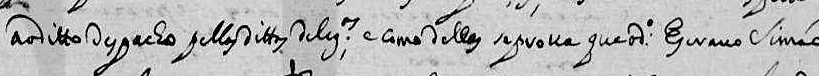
ao ditto despacho pellas dittas deligas; e como dellas se proua que o d.o Escrauo Simaõ
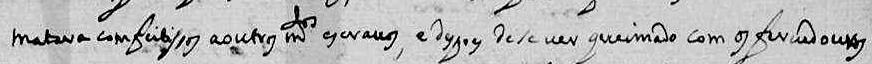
matava com feitissos a outros mtos escrauos, e despoes de se uer queimado com os feruedouros
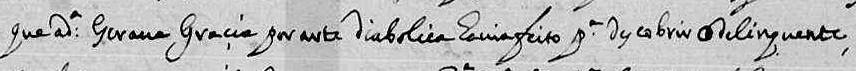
que a d:a escraua Gracia por arte diabolica hauia feito p.a descobrir o delinquente,
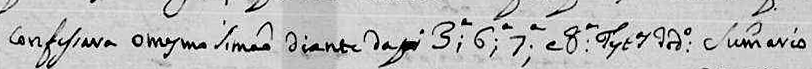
confessara o mesmo Simaõ diante da pr 3a; 6a; 7a; e 8:a Testas. do do: Sum̄ario
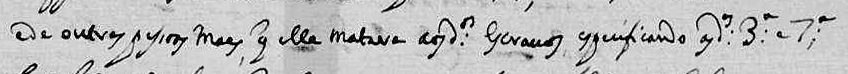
e de outras pessoas maes, q̄ elle matava aos d:os escrauos especificando as das: 3:a e 7a;
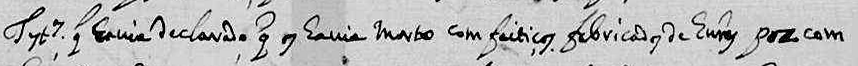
Testas; q̄ hauia declarado, q̄ os hauia morto com feitiços, fabricados de hun̄s poz com
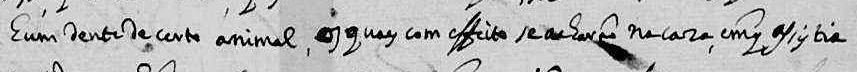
hum dente de certo animal, os quaes com effeito se acharaõ na caza, em q̄ assistia
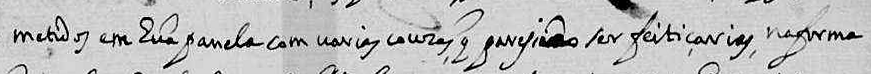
metidos em huā panela com uarias couzas, q̄ paressião ser feitiçarias, na forma
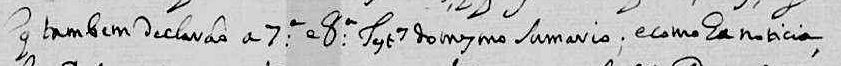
q̄ tambem declarão a 7:a e 8:a Testas do mesmo Sumario; e como ha noticia,
